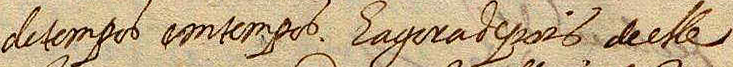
de tempos em tempos. E agora depois de elle
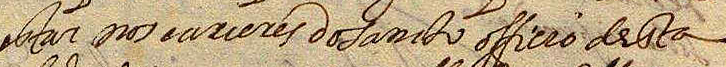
estar nos carceres do Sancto officio desta
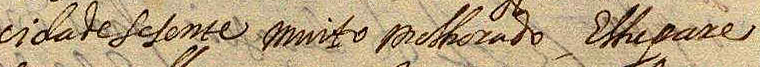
cidade se sente muito melhorado, e lhe pare
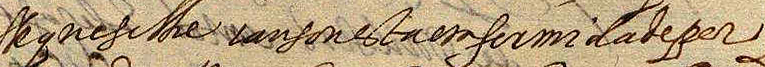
sse que se lhe causou esta emfermidade per
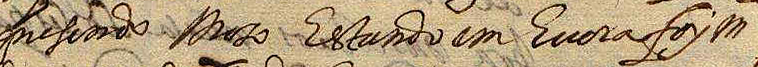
que sendo moso estando em Evora foy m. to
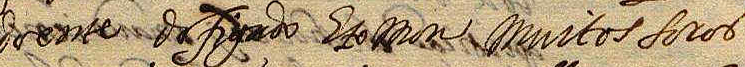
doente do figado e tomou muitos soros
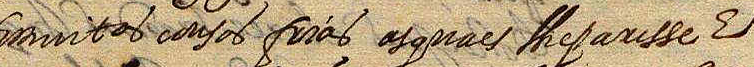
e muitas cousas frias as quaes lhe paresse e
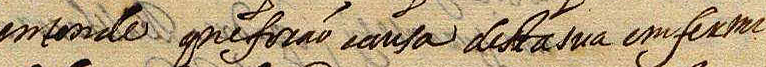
entende que foraõ causa desta sua emfermi
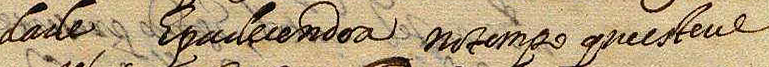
dade e padecendo a no tempo que esteve em
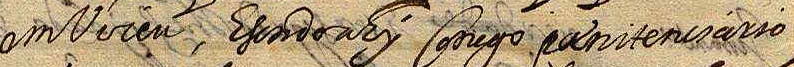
em Vízeu, e sendo ahy Conego penitenciario
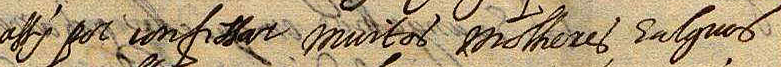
assy por confissar muitas molheres, e alguas
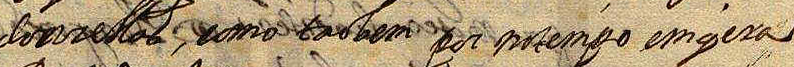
donzellas, como tãobem por no tempo em q̄ era
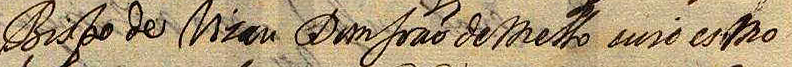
Bispo de Vízeu Dom João de Mello cujo esmo
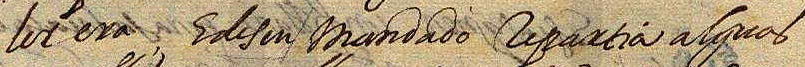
ler era, e de seu mandado repartia algūas
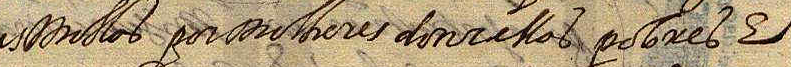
esmollas por molheres donzellas pobres e
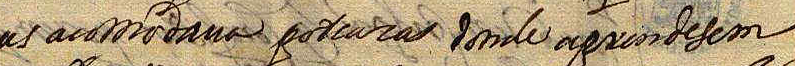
as acomodava por cazas donde aprendesem
